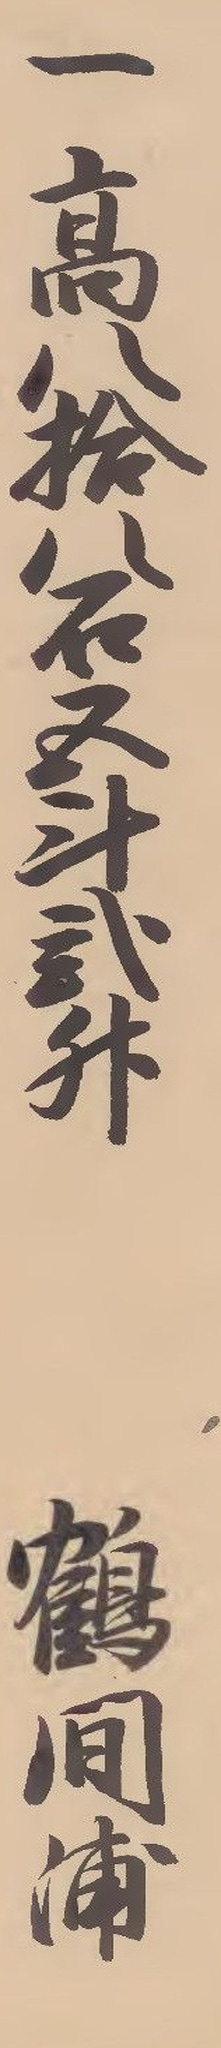一高八拾八石五斗弐升鶴間浦

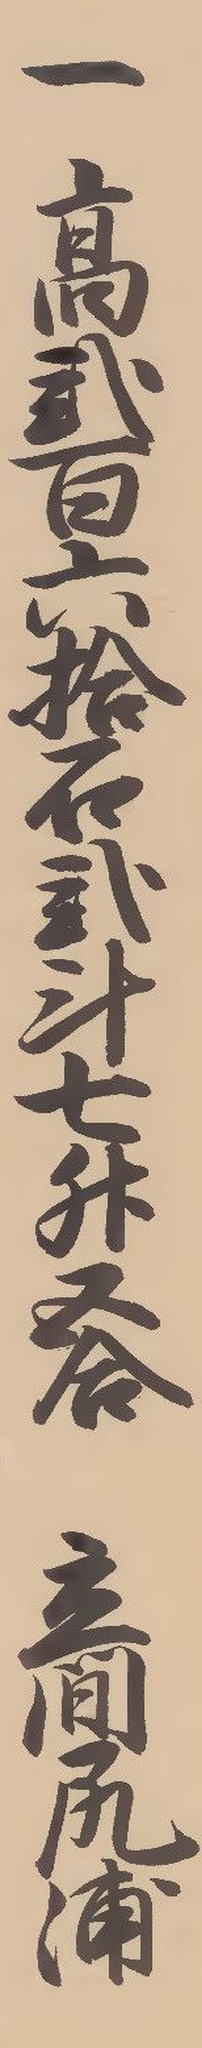一高弐百六拾石弐斗七升五合立間尻浦
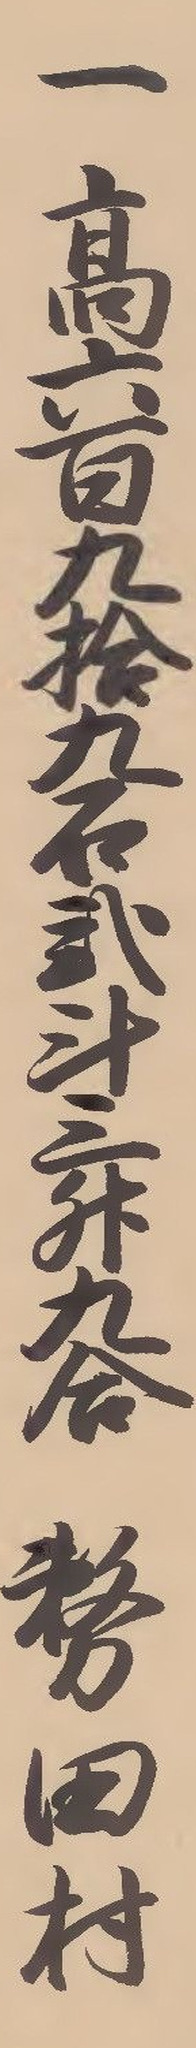一高六百九拾九石弐斗三升九合務田村
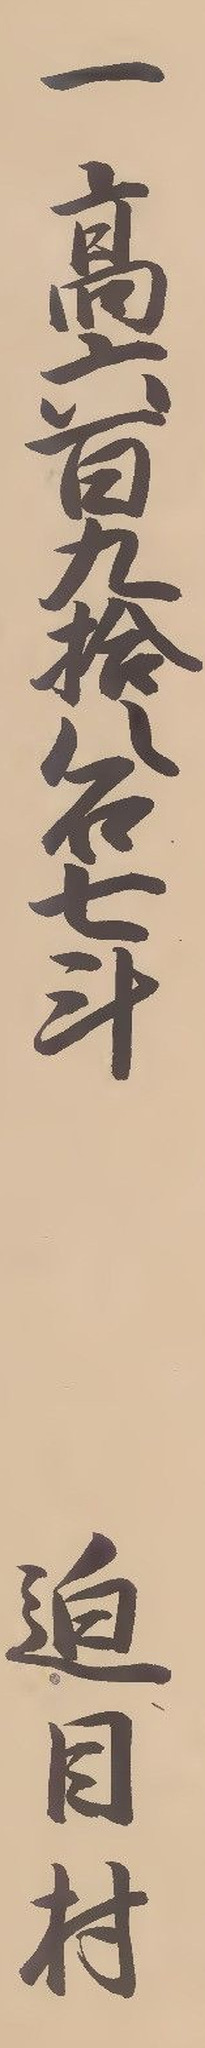一高六百九拾八石七斗迫目村
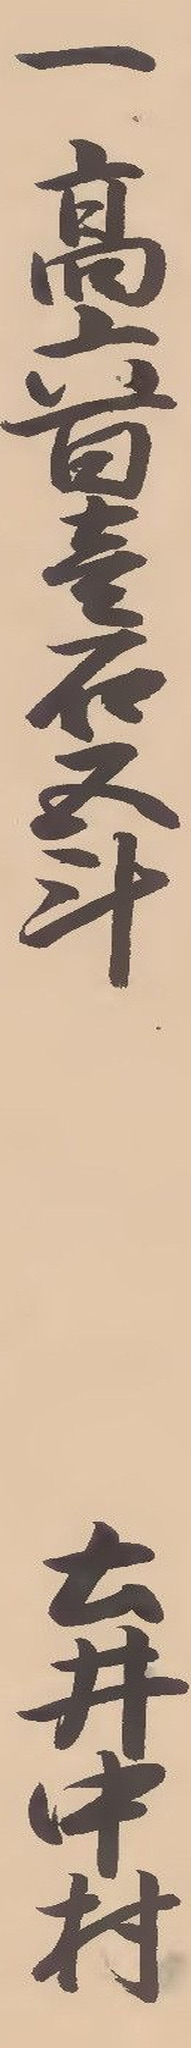一高六百壱石五斗土井中村
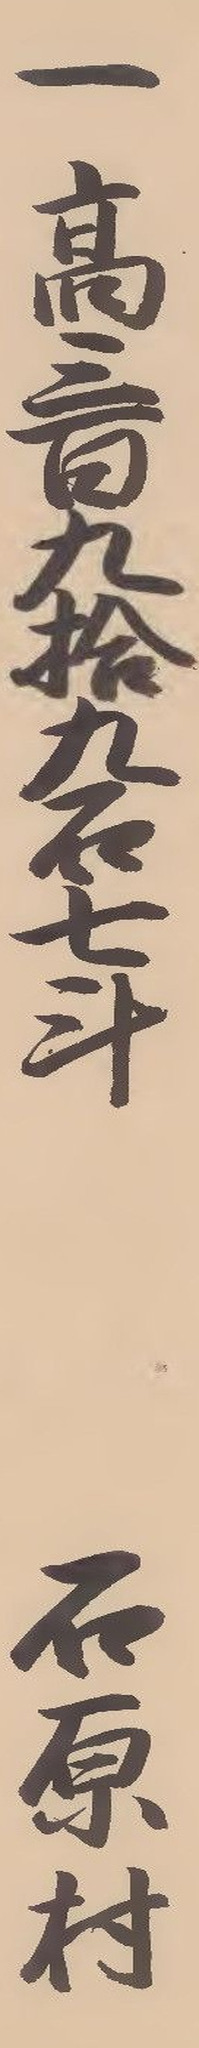一高三百九拾九石七斗石原村
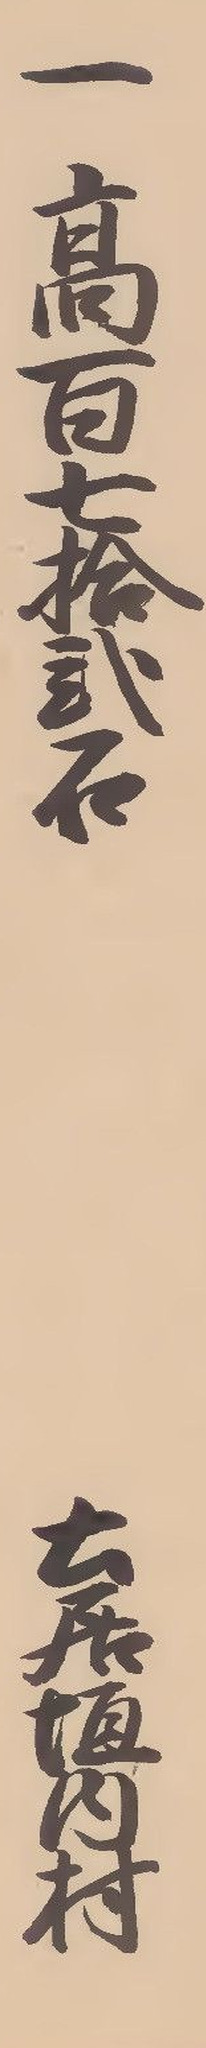一高百七拾弐石土居垣内村

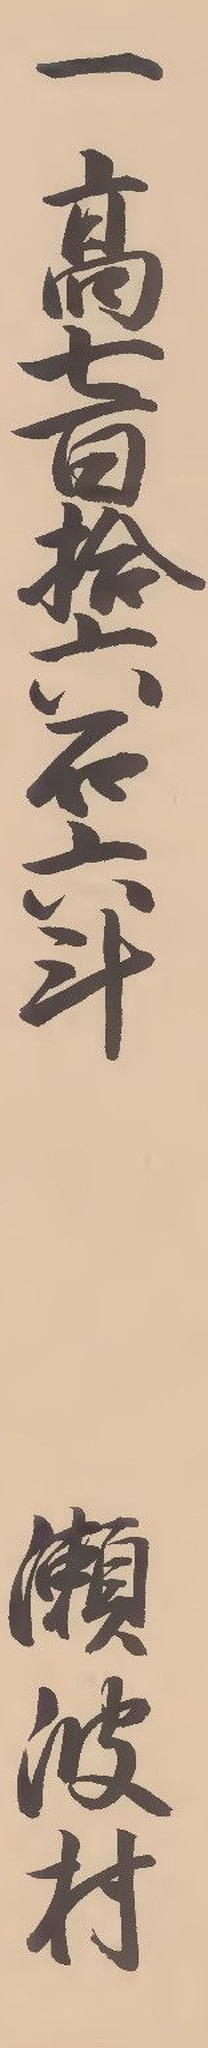一高七百拾六石六斗瀬波村
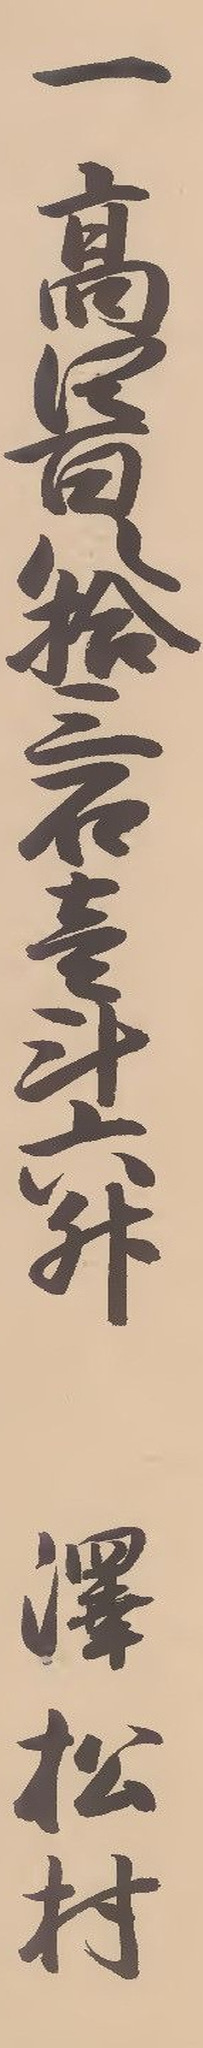一高四百八拾三石壱斗六升沢松村
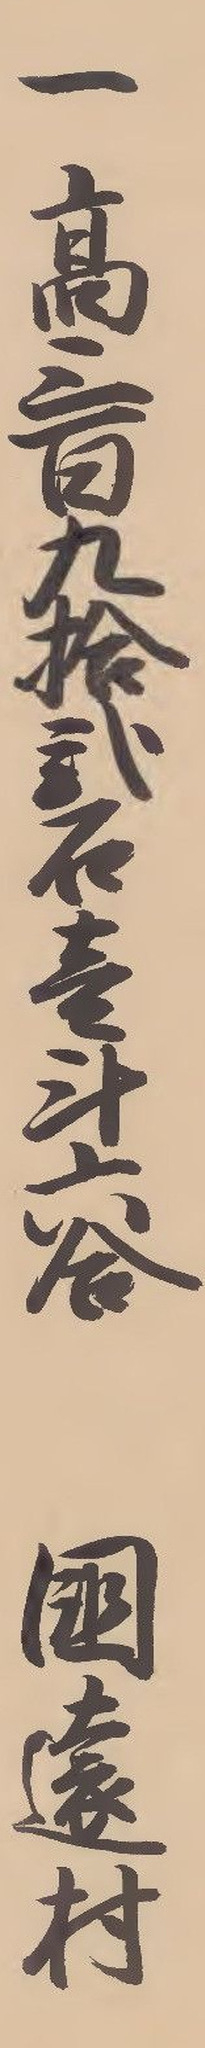一高三百九拾弐石壱斗六合国遠村
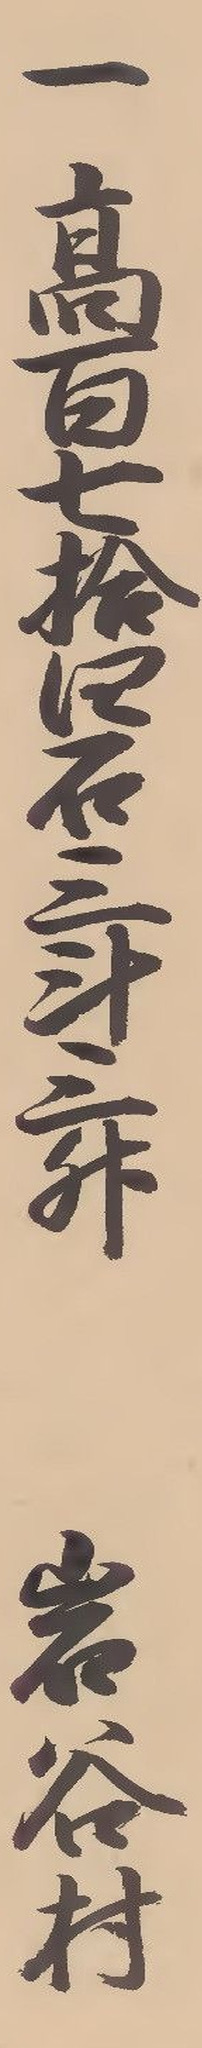一高百七拾四石三斗三升岩谷村
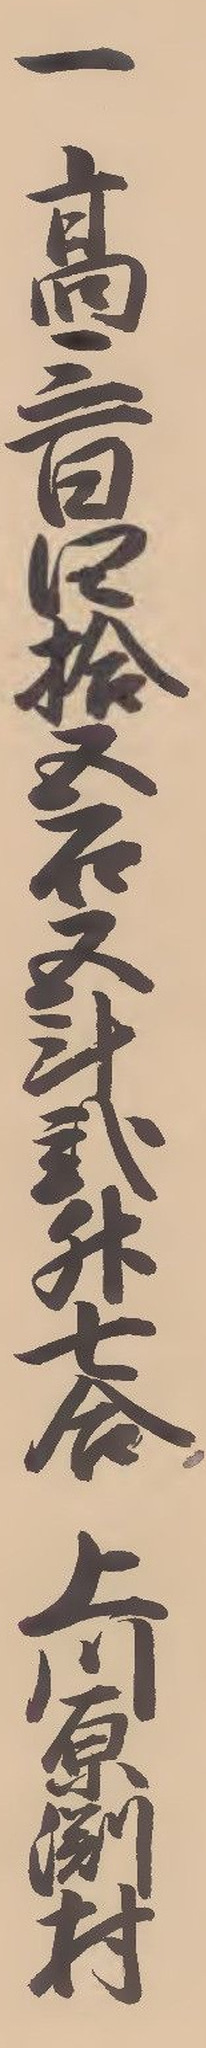一高三百四拾五石五斗弐升七合上川原淵村

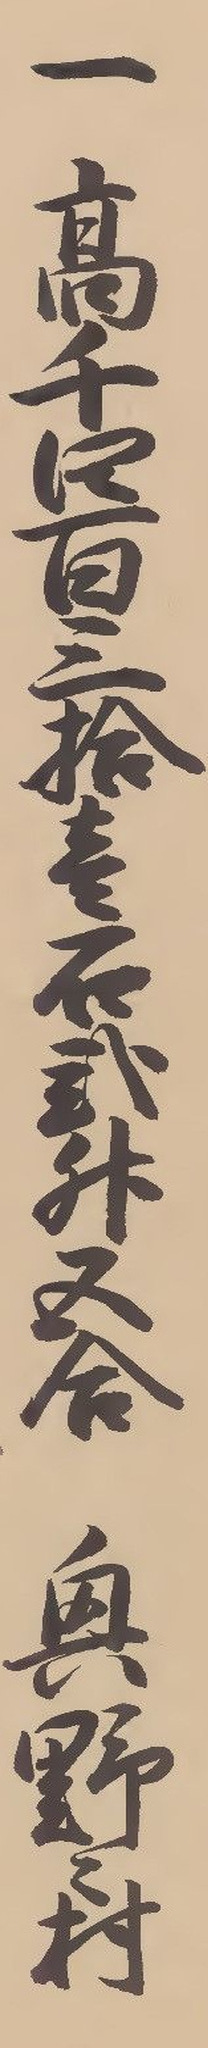一高千四百三拾壱石弐升五合興野々村
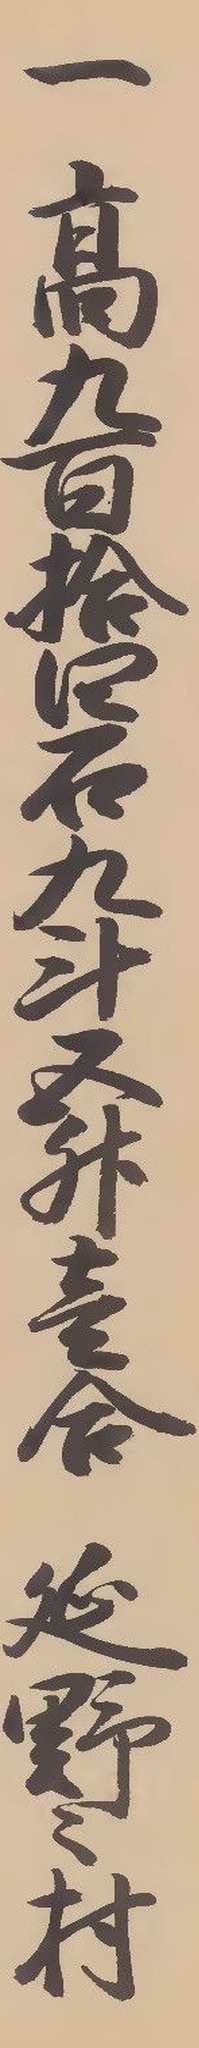一高九百拾四石九斗五升壱合延野々村
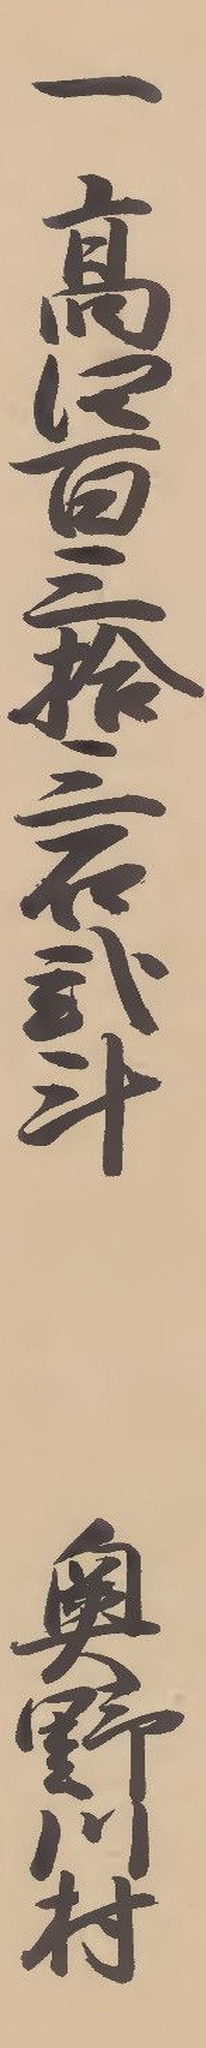一高四百三拾三石弐斗奥野川村
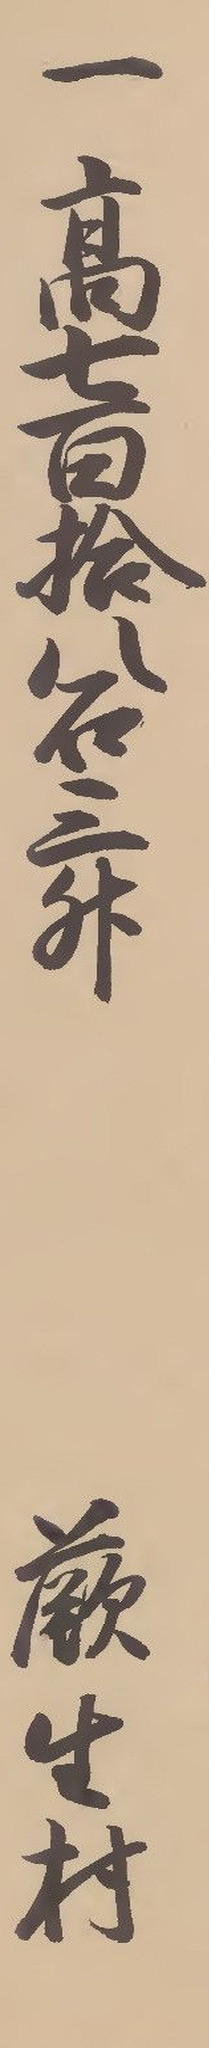一高七百拾八石三升蕨生村
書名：伊予国郷帳
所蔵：国立公文書館 National Archives of Japan
